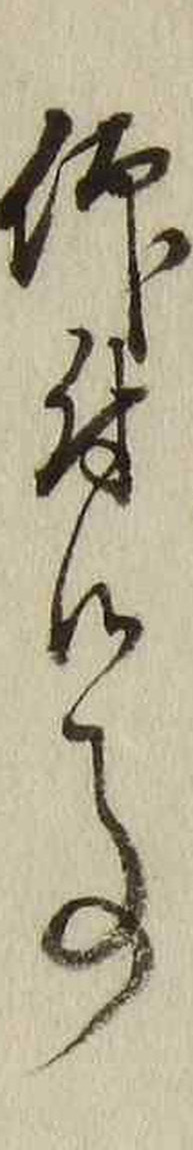仰付候事
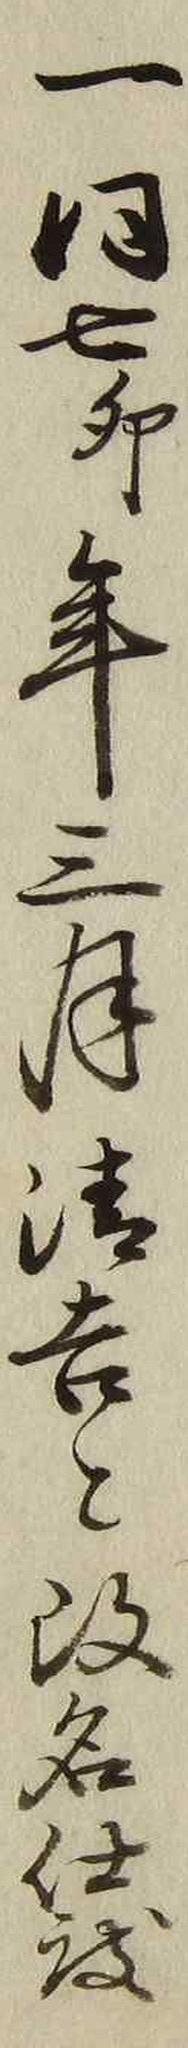一同七卯年三月清吉と改名仕度
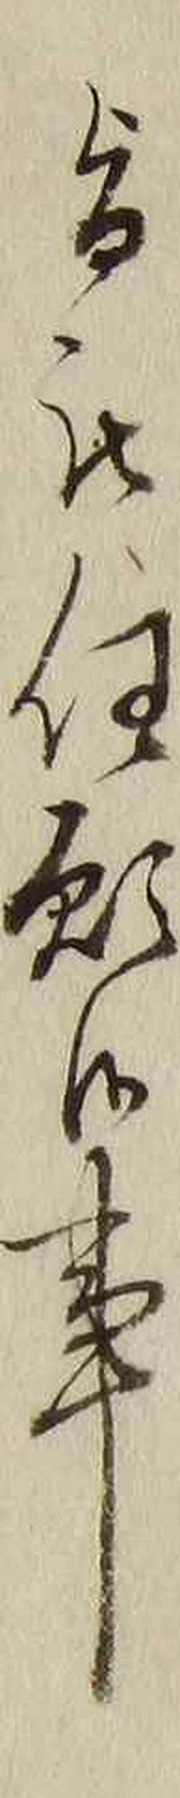旨被任願候事
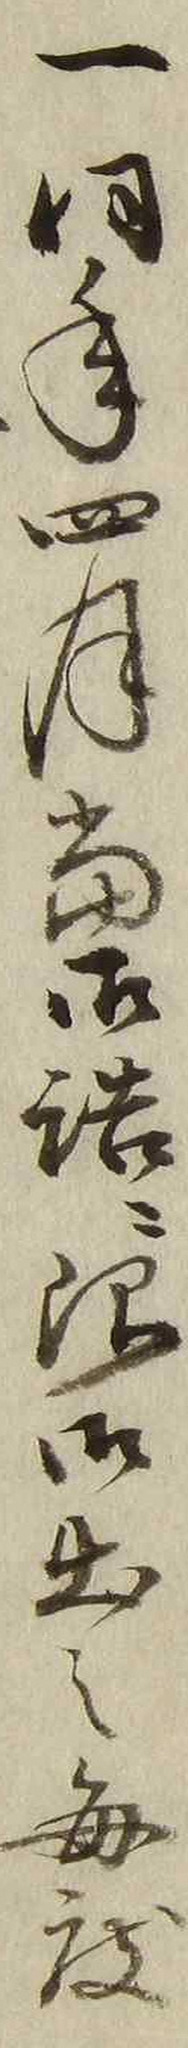一同年四月当御詰ニ限御出之毎度
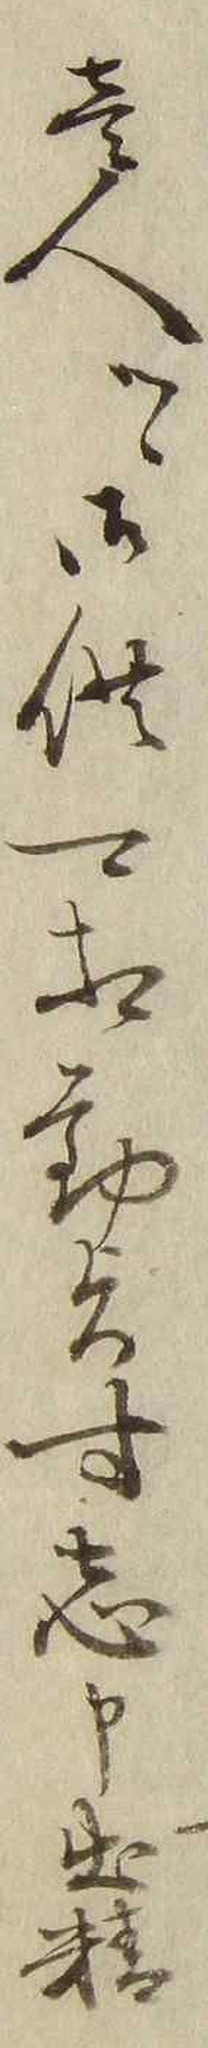壱人ツヽ御供可相勤旨寸志申出精

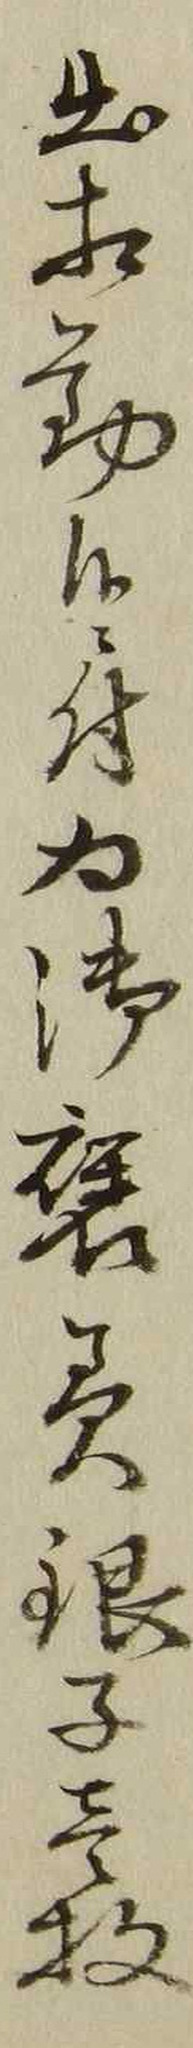出相勤候ニ付為御褒美銀子壱枚
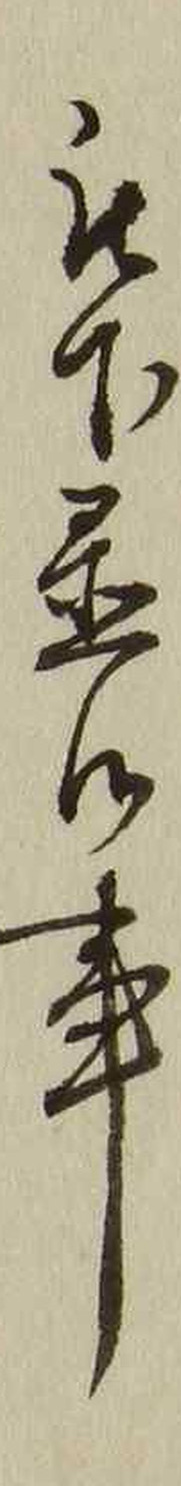被下置候事
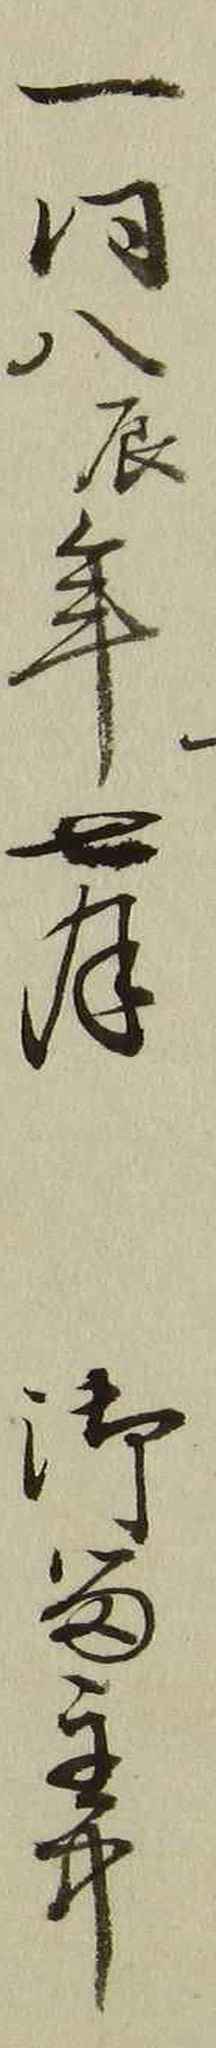一同八辰年七月御留主中
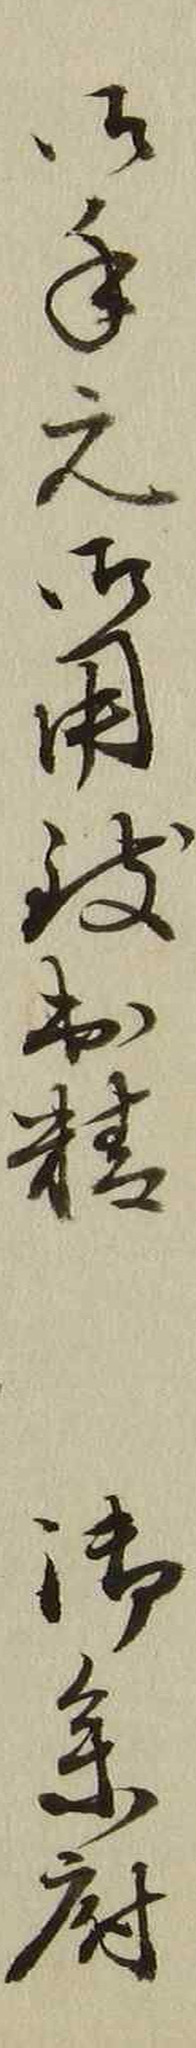御手元御用致出精御参府
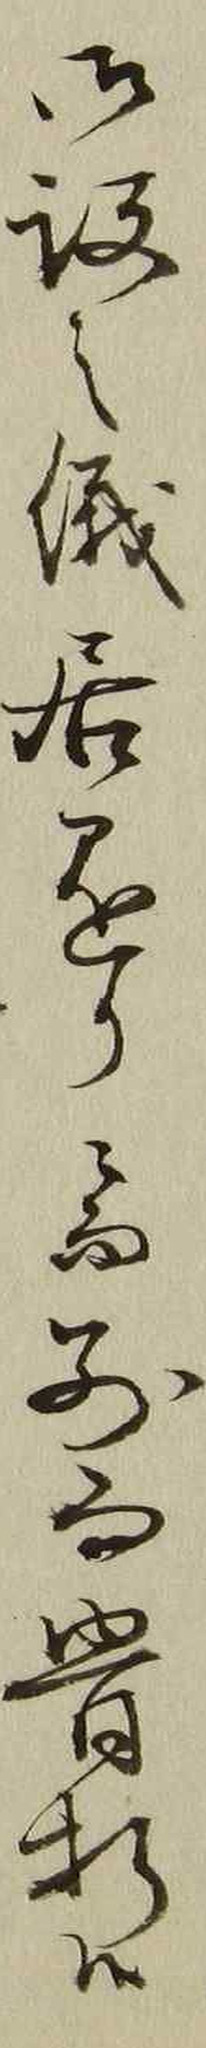御設之儀居懸りニ而別而骨折候
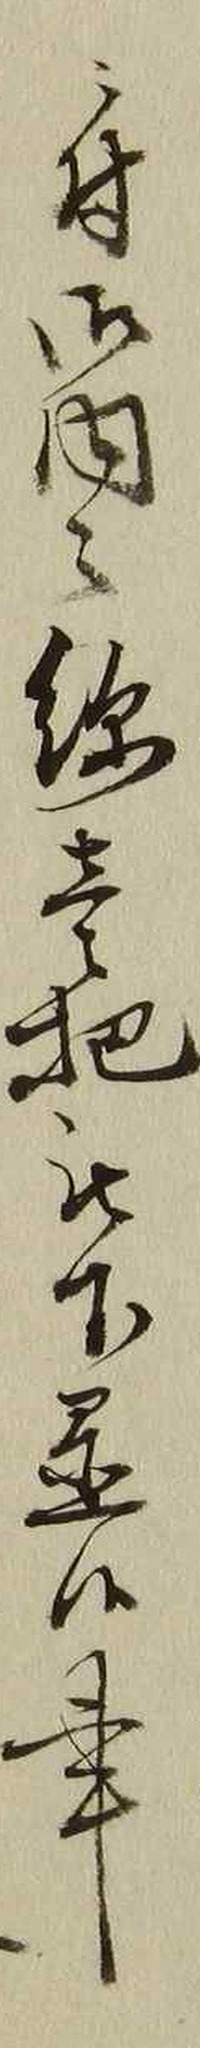ニ付御内々綿壱把被下置候事
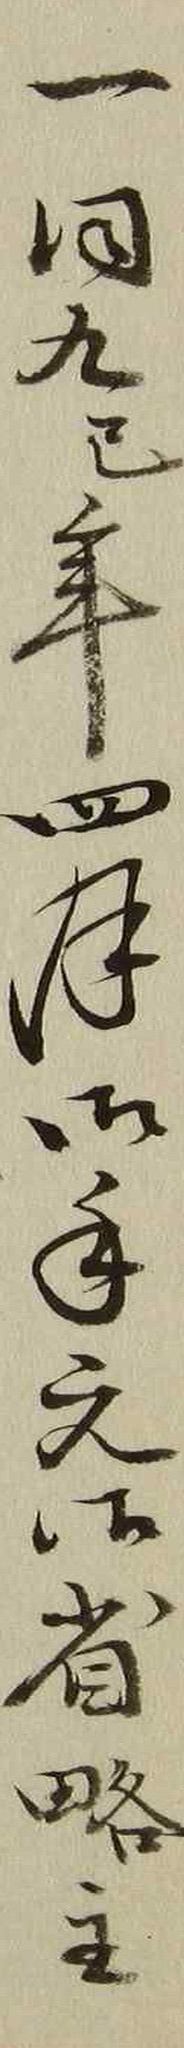一同九巳年四月御手元御省略主
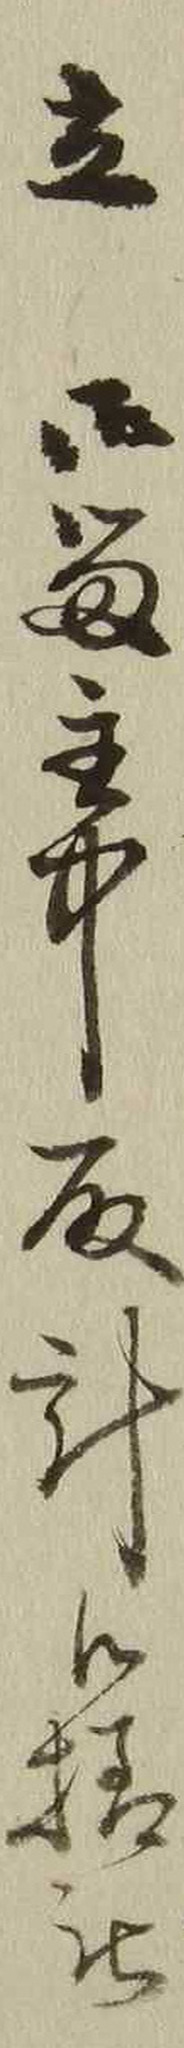立御留主中取計候様被
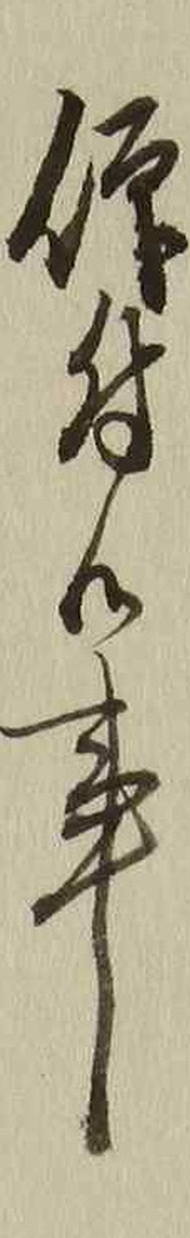仰付候事
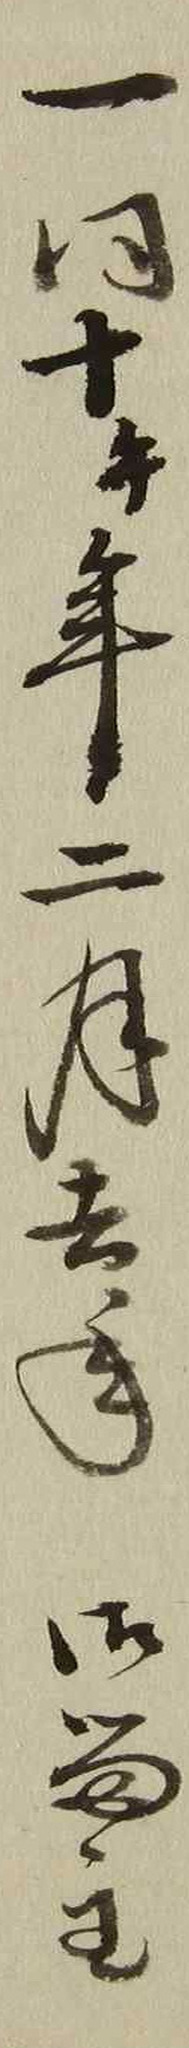一同十午年二月去年御留主
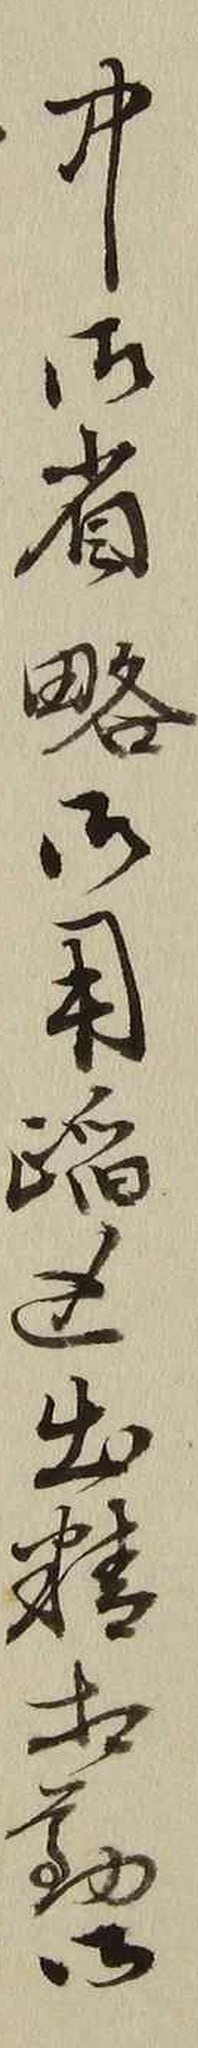中御省略御用蹈込出精相勤御
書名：諸士系譜　巻之35　は之部3
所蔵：会津若松市立会津図書館
